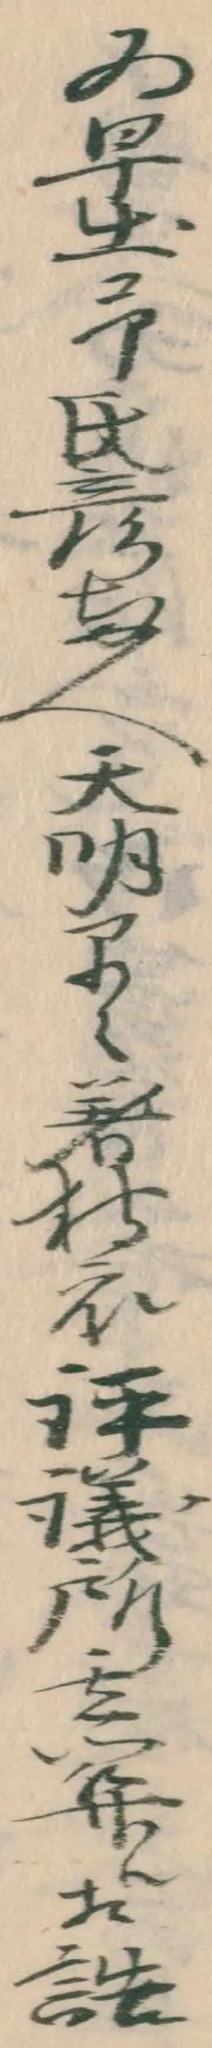為早出予氏彦両人天明早々着狩衣評議所玄関え相詰
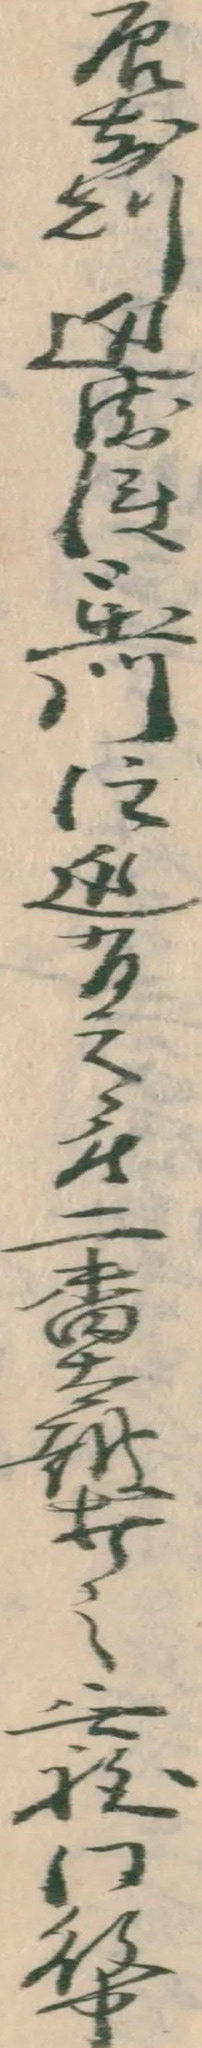辰前刻近衛使御出門注進有之ニ付二番太皷打之無程同役中
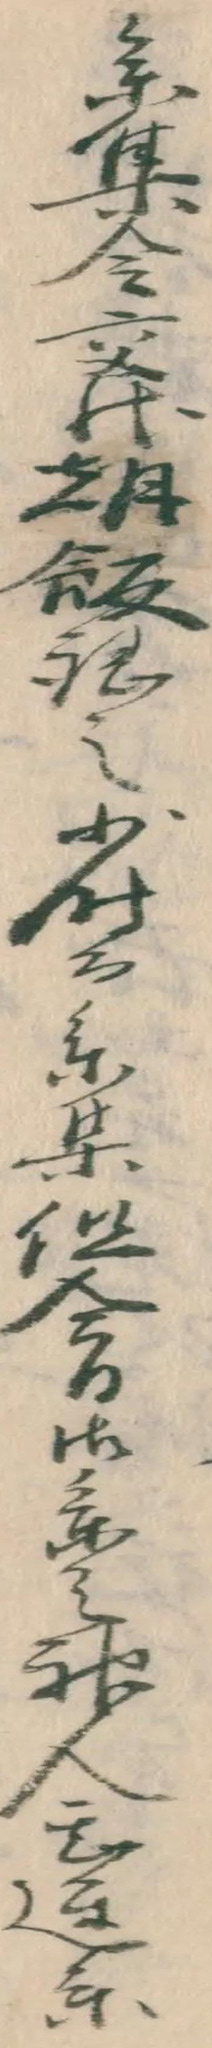参集令交代朝飯認之少時而参集但今日御参之神人其途参
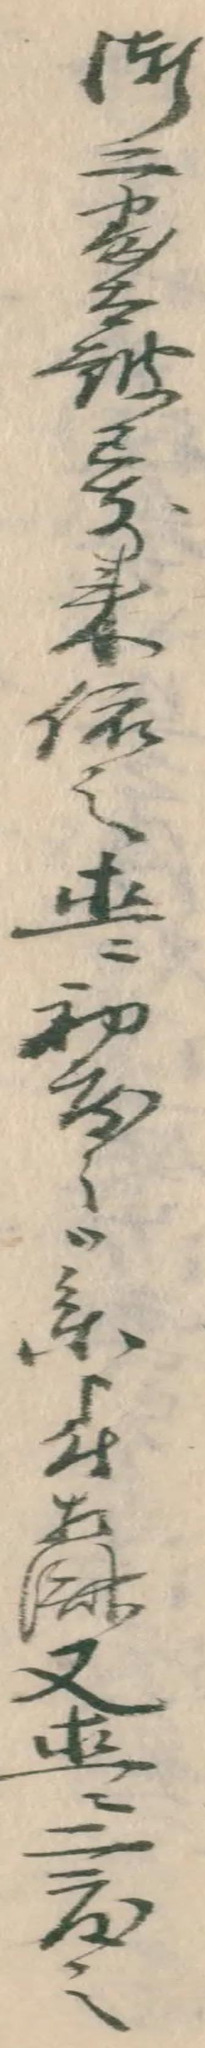漸二番太皷已前来依之直二初度之御参申付相済又直ニ二度之
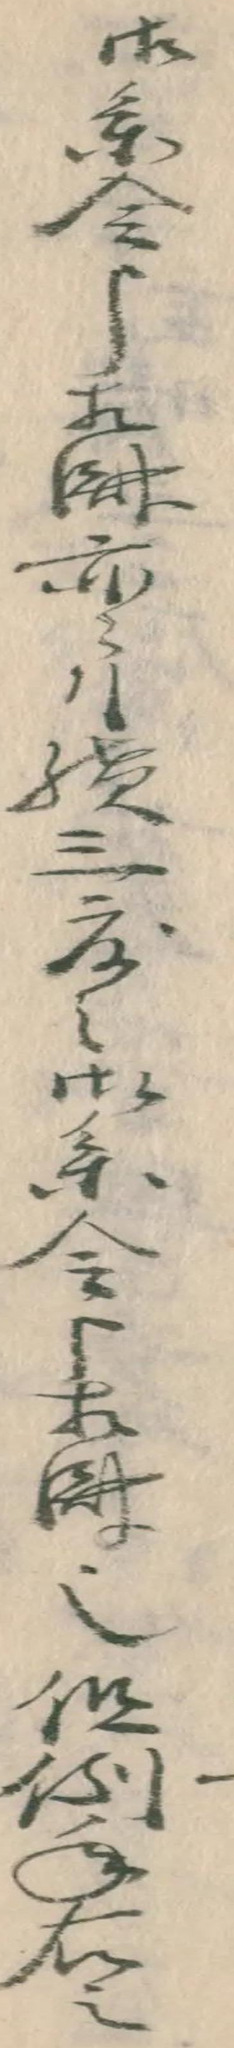御参令申相済亦々引續三度之御参令申相済也但例年右之
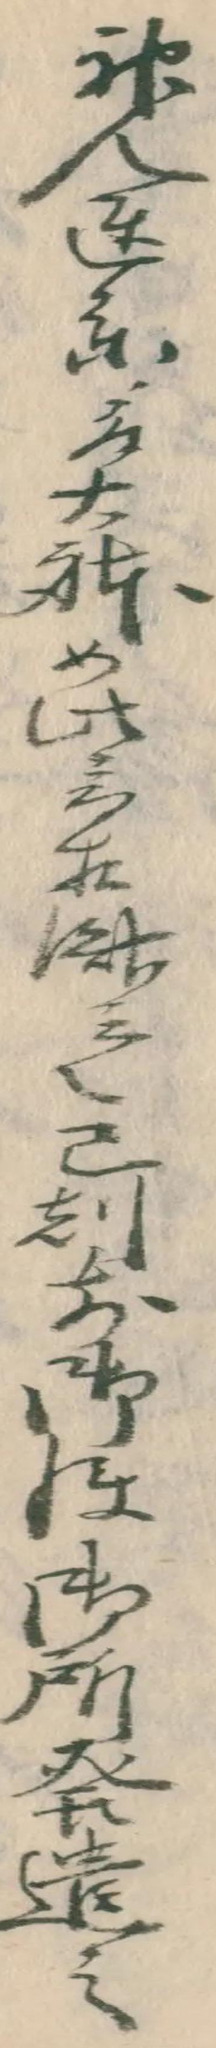神人連参ニ而大躰如此ニ而相済云々巳刻前御役御所発遣之
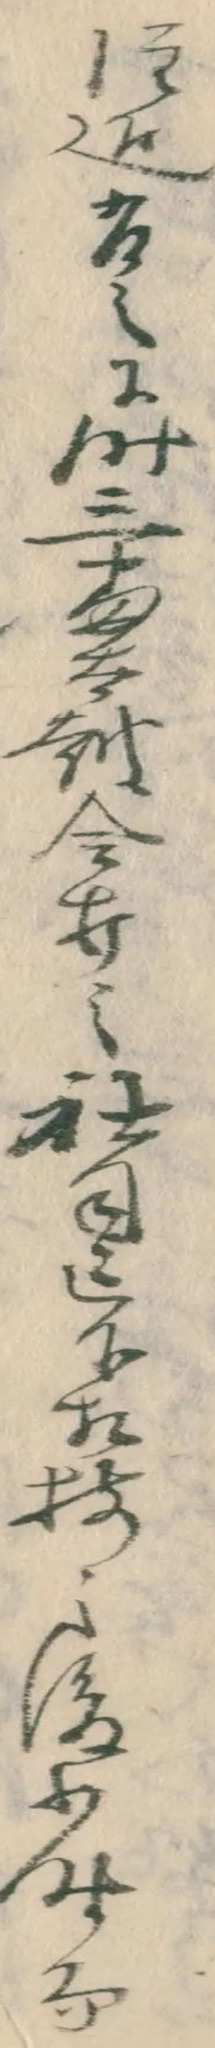注進有之候時三番太皷令打之社司已下相揃之後少時而
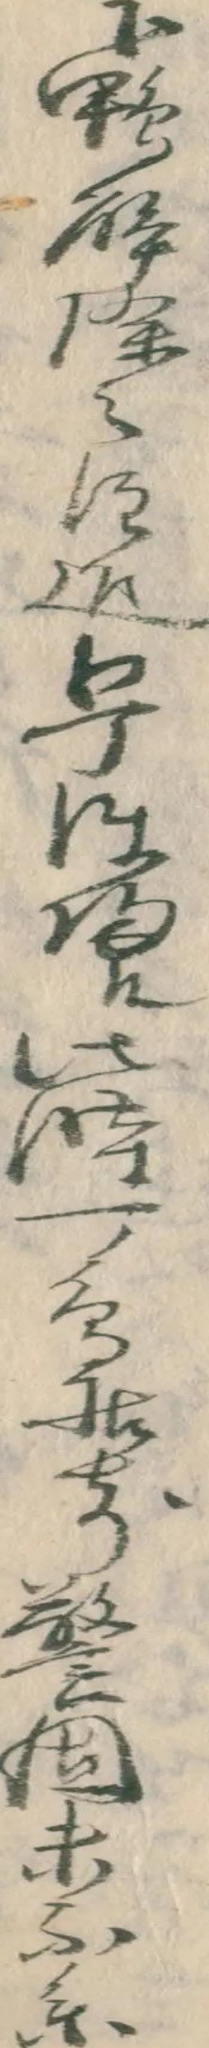下鴨解除之注進早役帰ル此時一ノ鳥居前警固未不参
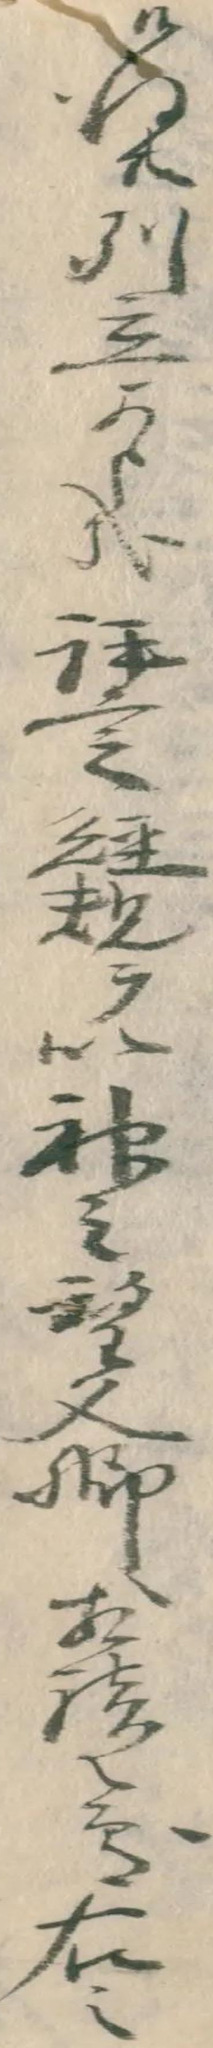候得共列立可申哉評定経規ヲ以神主望久郷へ相談之處右之
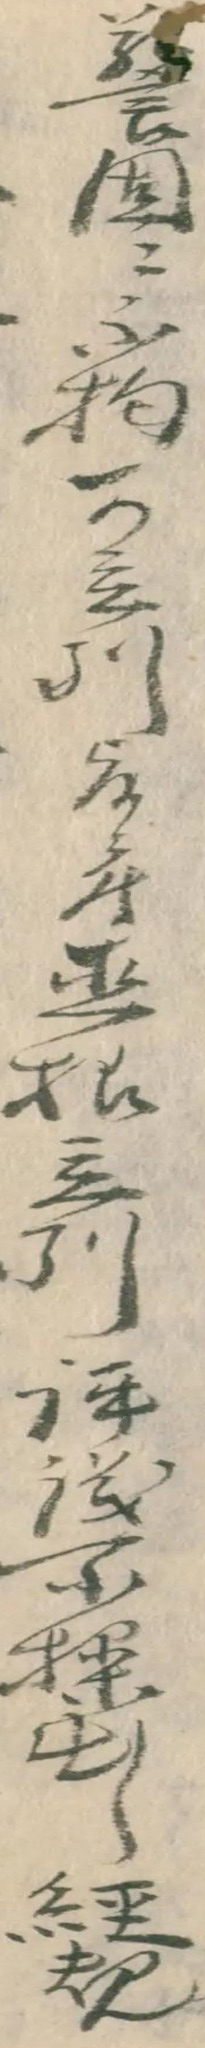警固ニ不拘可立列旨ニ付直招立列評議所操出し経規
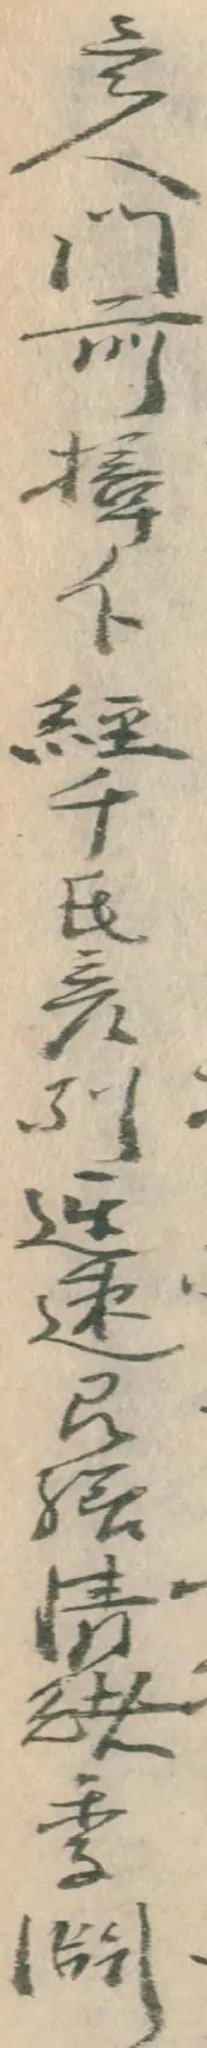壱人門前樟ノ下経千氏彦列遅速即膳清緒季淵

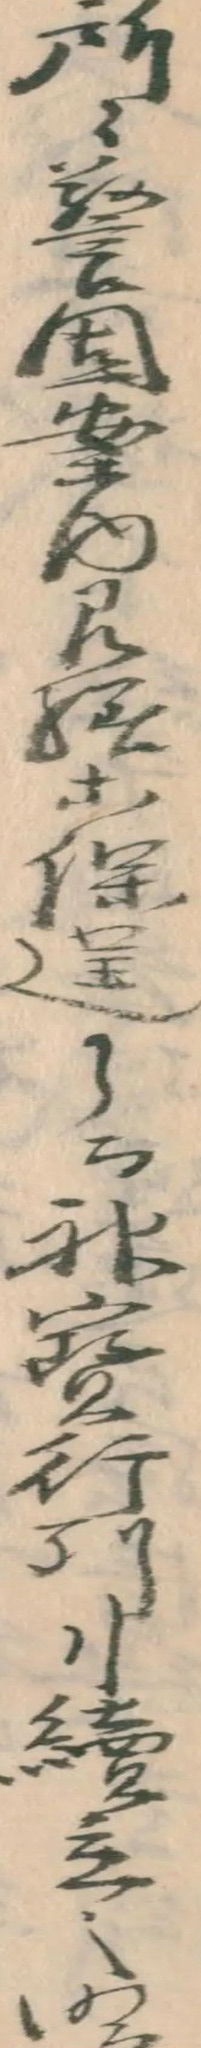所々警固案内見繕等保逞了而神寶行列引續立之仍而
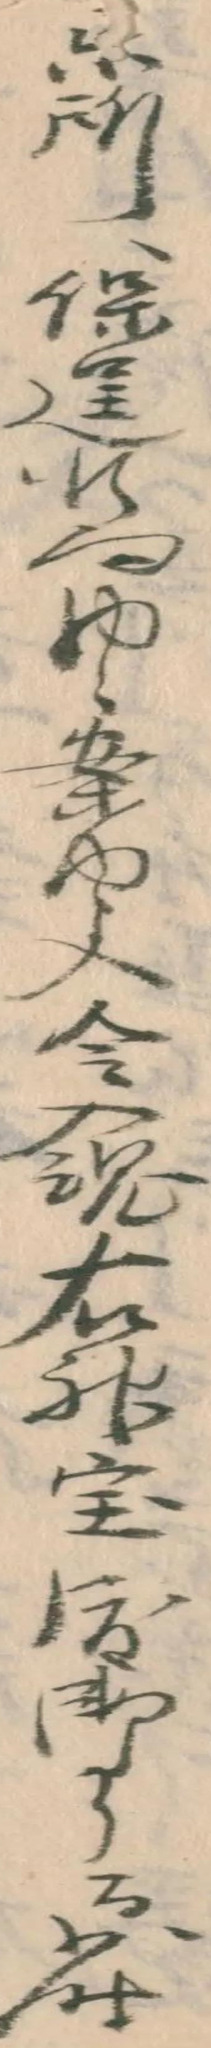所へ保逞行向内之案内申入令入魂右神宝渡御了而少時
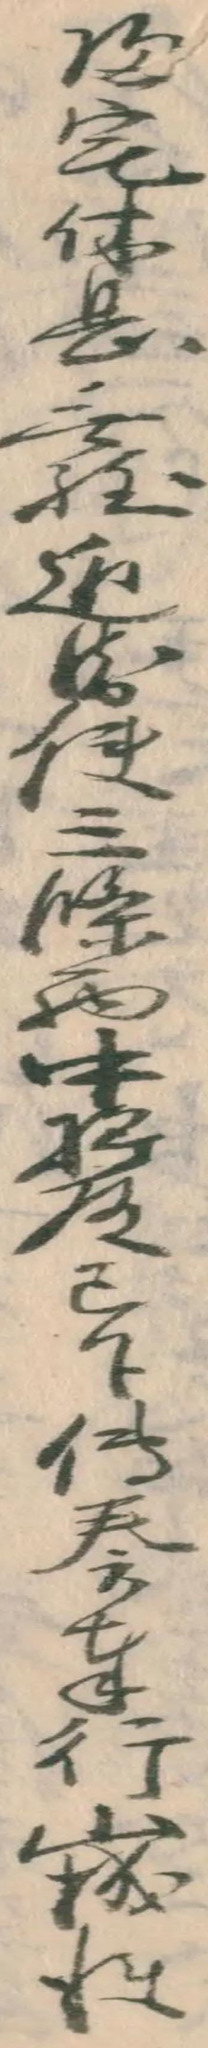帰宅休息無程近衛使三條西中将殿已下傳奏奉行山城使
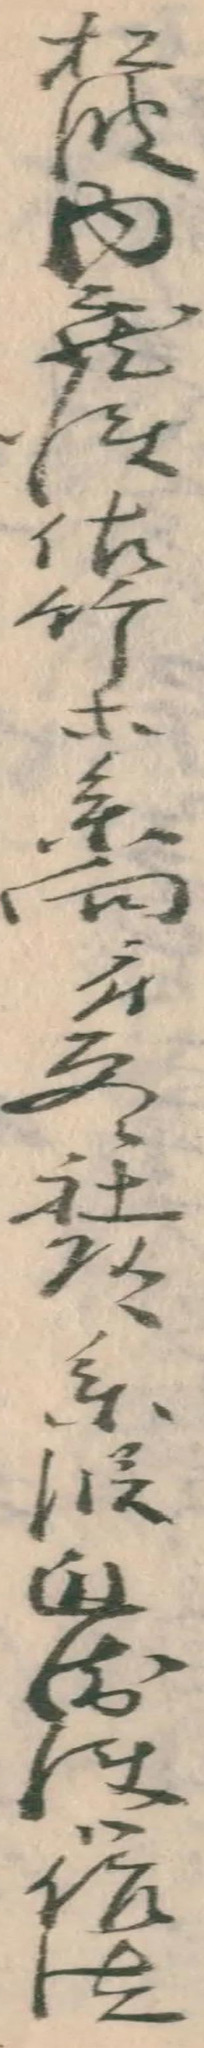松波内蔵使佐竹等参向ニ付更ニ社頭へ参段近衛使御作法
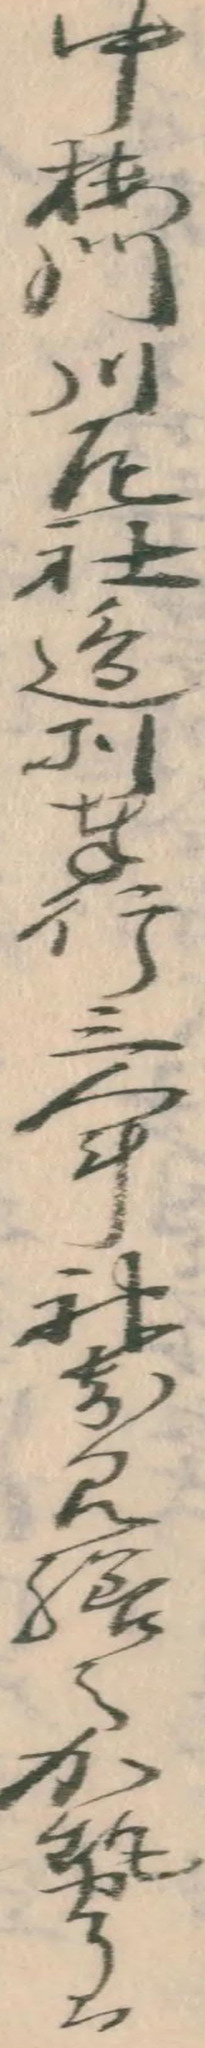中楼門川尾社邊列奉行三人斗神前見繕之加勢了而
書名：賀茂社記録. 第66冊
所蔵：国立国会図書館 National Diet Library, JAPAN
